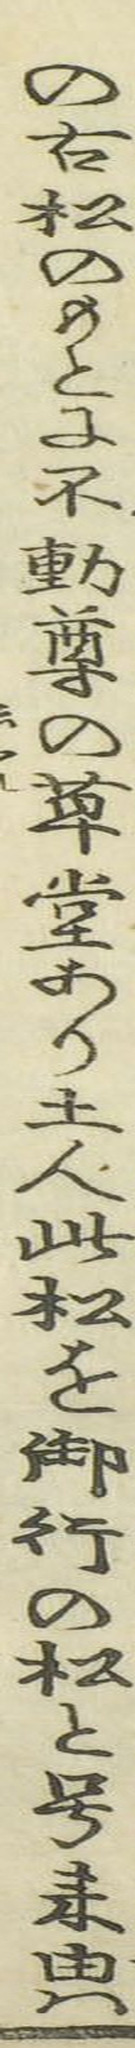の古松のもとに不動尊の草堂あり土人此松を御行の松と号来由は
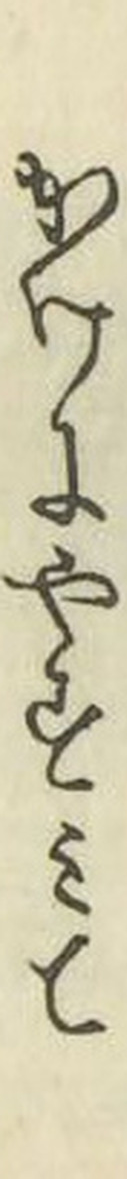かけにやすみて
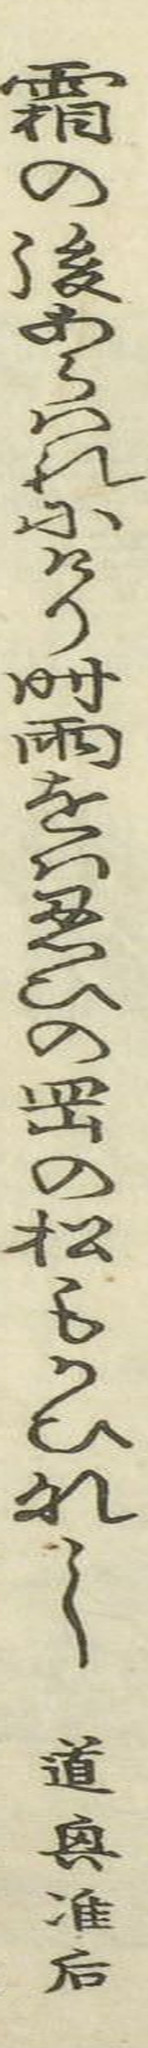霜の後あらはれにけり時雨をは忍ひの岡の松もかひなし道興准后
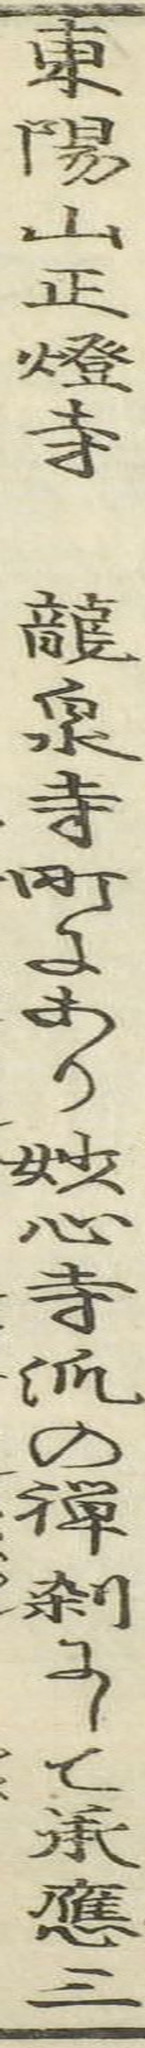東陽山正燈寺龍泉寺町にあり妙心寺派の禅刹にして承応三
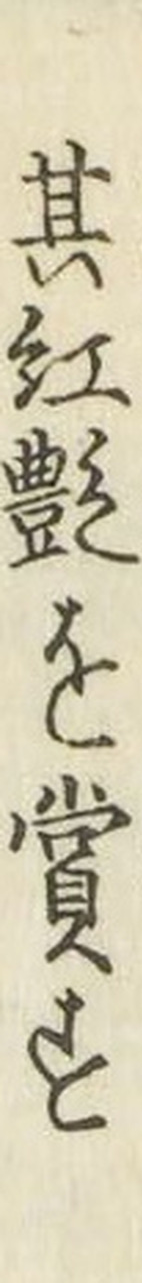其紅艶を賞す
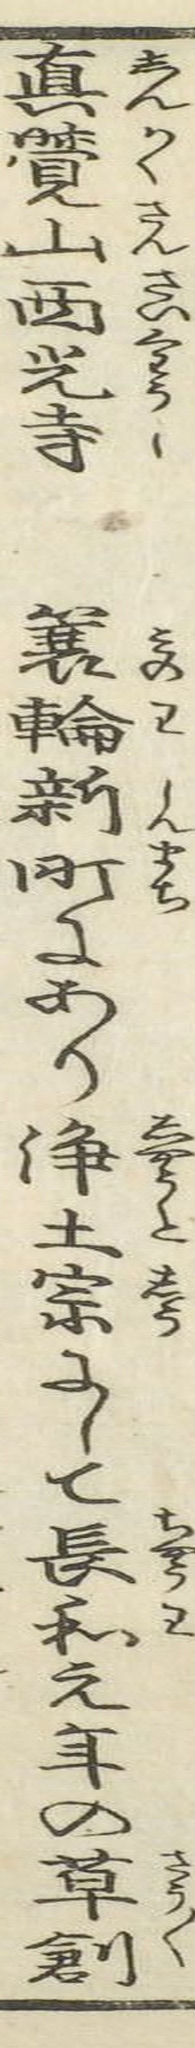真覚山西光寺蓑輪新町にあり浄土宗にして長和元年の草創
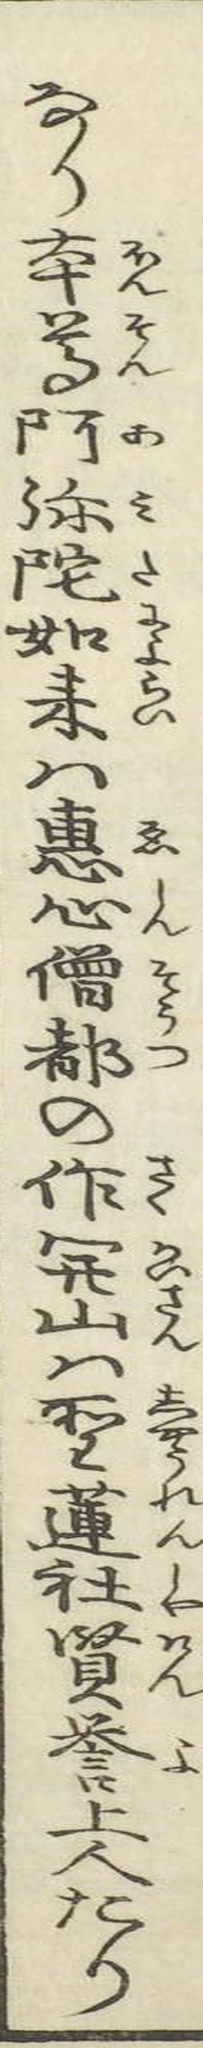なり本尊阿弥陀如来は恵心僧都の作開山は聖蓮社賢誉上人たり
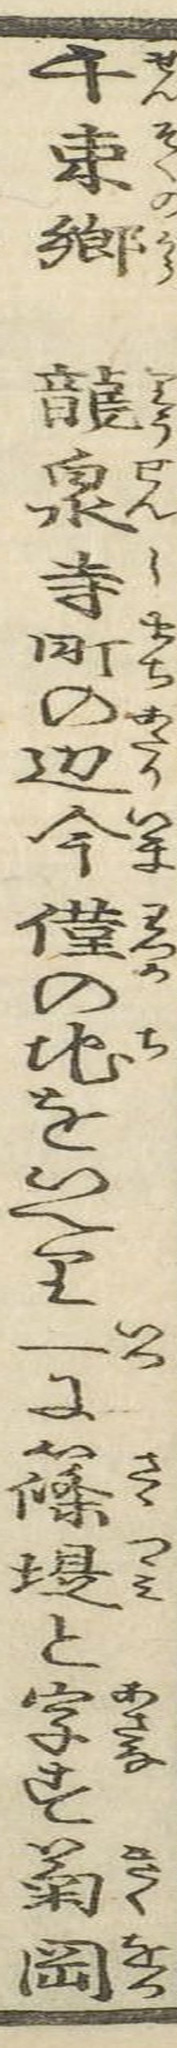千束郷龍泉寺町の辺今僅の地をいへり一に篠堤と字す菊岡
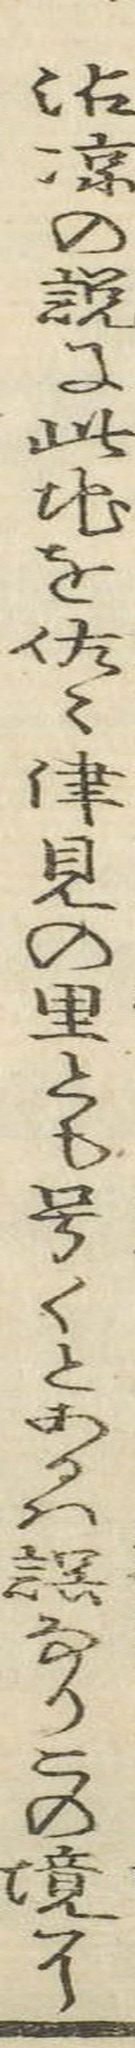沾涼の説に此地を佐々津見の里とも号くとあるは誤なりこの境に
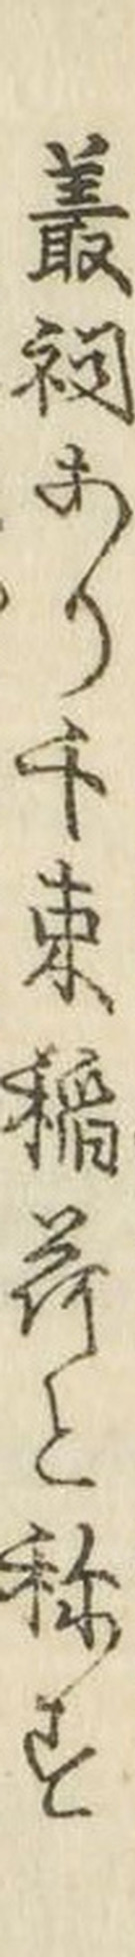叢祠あり千束稲荷と称す
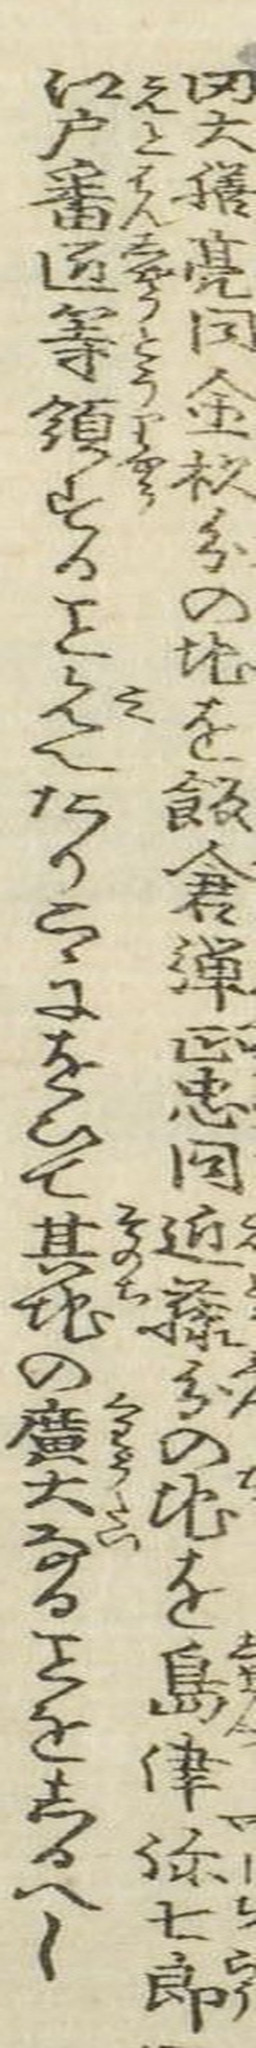江戸番匠等領すること見へたりこゝにをひて其地の広大なることをしるへし
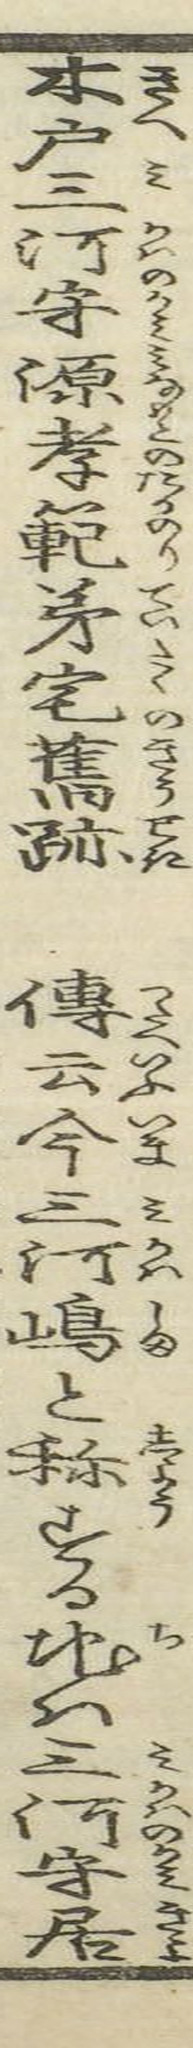木戸三河守源孝範弟宅旧跡伝云今三河嶋と称する地は三河守居
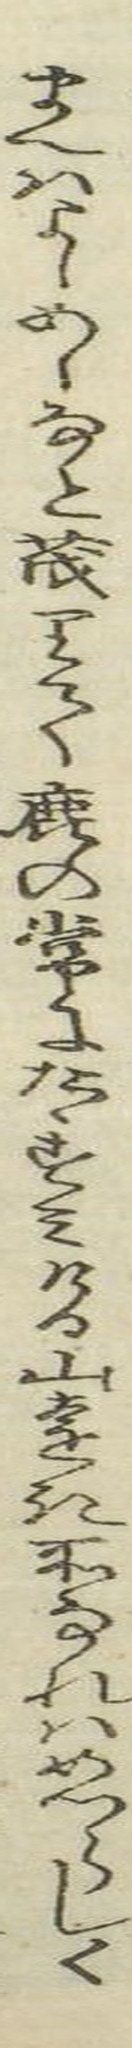まへはよしあしなと茂りて鹿の常にたゝすみける山遠き所なればめつらしく
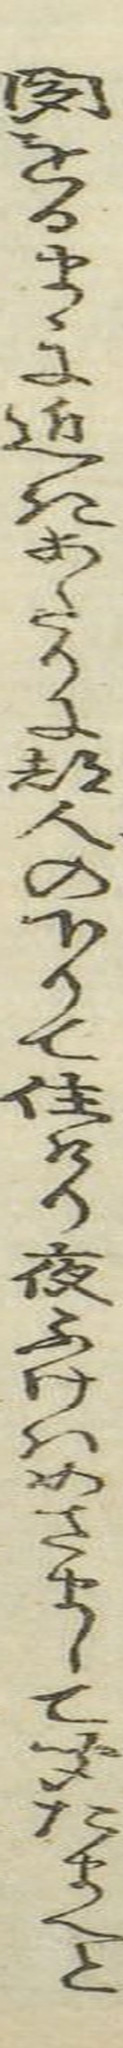聞をるまゝに近きあたりに都人の下りて住けり夜ふけはめさまして聞たまへと
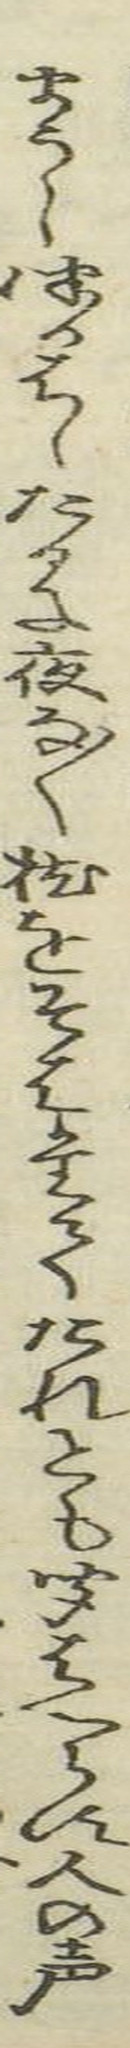まうしつかはしたるに夜な〳〵枕をそはたてたれとも聞はへらす人の声
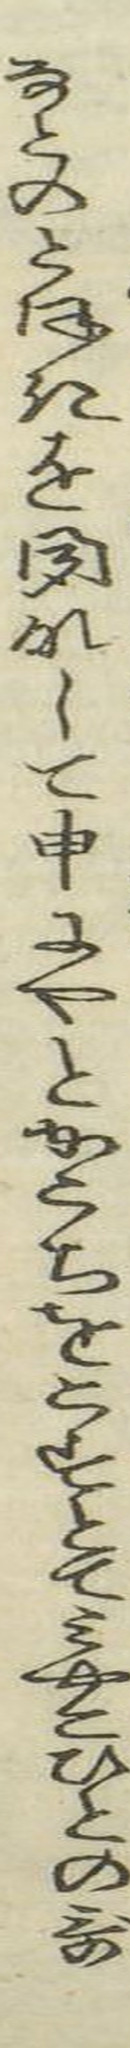なとのとほきを聞なして申にやとかこちをこすとてみやこひとの哥
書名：江戸名所図会 20巻 巻之17
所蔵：東京学芸大学教育コンテンツアーカイブ
